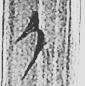人
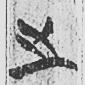之
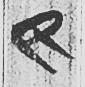女
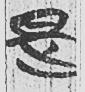是
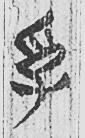孚
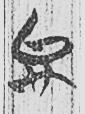{㠯心}
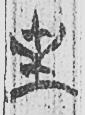生
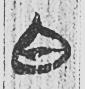白
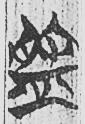盤
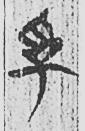孚
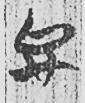{㠯心}
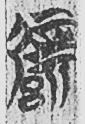辟
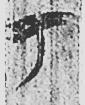于
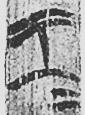王=
